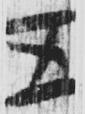五
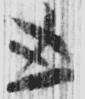之
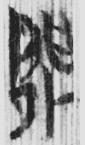○（間）
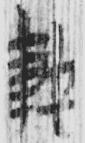○（載）
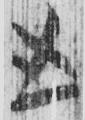之
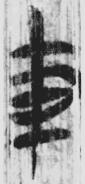車
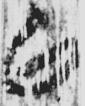㠯（以）
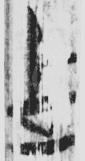上B（上）
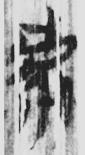{虍介}（乎）
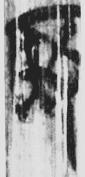殹（繄）
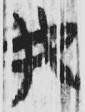四
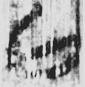㠯（以）
